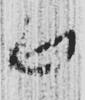㠯（以）
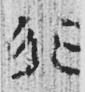行
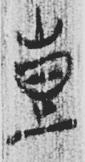壴（矣）
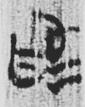爲
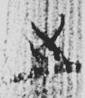之
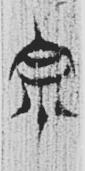宗
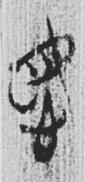○（謀）
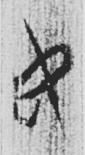女（汝）
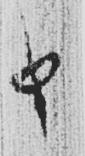中（仲）
